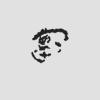畜
